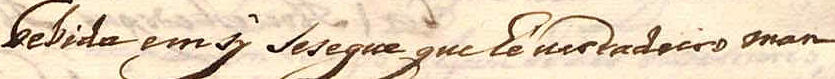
bebida em sy se segue que hé uerdadeiro man
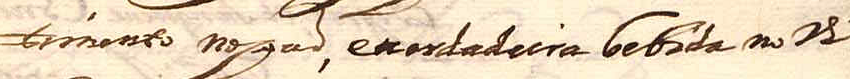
timento no paõ, e uerdadeira bebida no vi
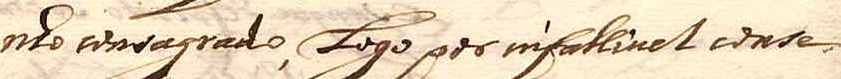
nho consagrado, Logo por infalliueL conse
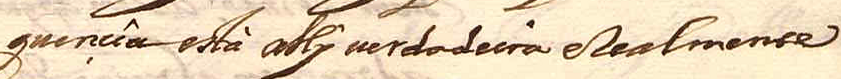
quençia está ally uerdadeira e Realmente
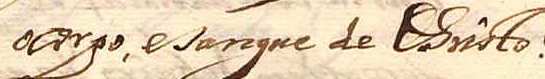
o corpo, e sangue de Christo?
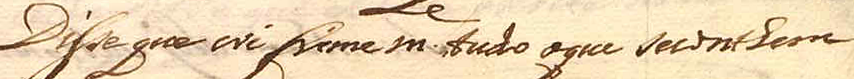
Disse que cré firmem.te tudo o que se conthem
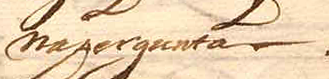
na pergunta - .
